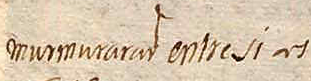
murmuraraõ entre si as
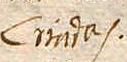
Criadas.
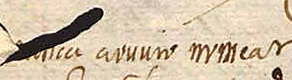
_eu a ouuir nomear
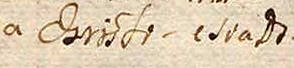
a christo. e so a Ds̄.
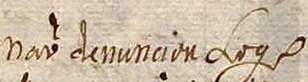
naõ denunciou Logo
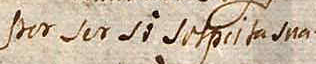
por ser só sospeita sua
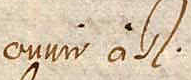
ouuir a R.
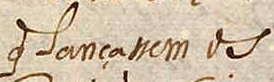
q̄ lançassem os
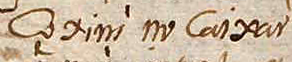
Coxins no caixaõ
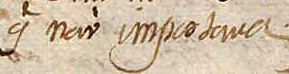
q̄ naõ importaua
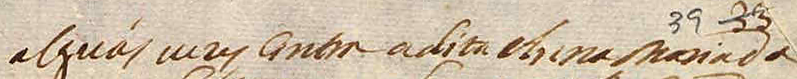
alguās uezes contra a dita Anna Maria da
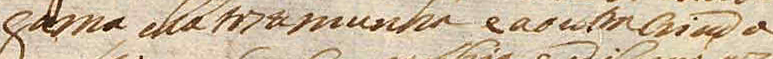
gama ella testemunha e a outra criada
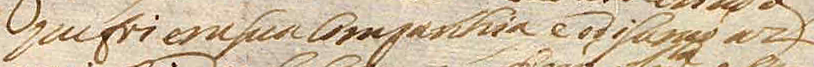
que foi em sua companhia e o disse naõ az
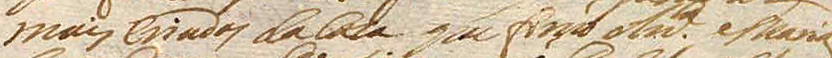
mais criadas da caza que forão An.ta e Maria
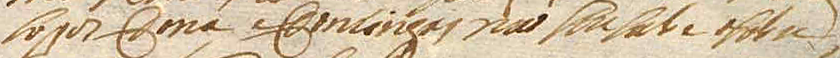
lopes Dona e Domingas naõ lhe sabe o sobre
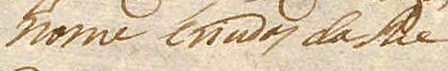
nome criadas da Re
